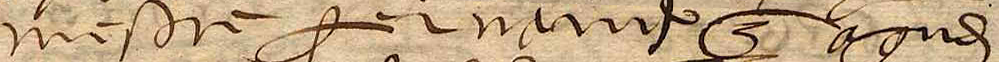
mestre fernamdo item a gudj
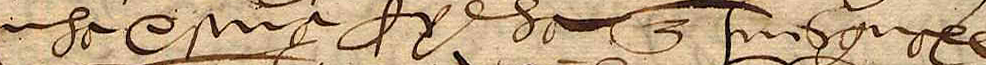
nha e sua fylha item Jnes guall
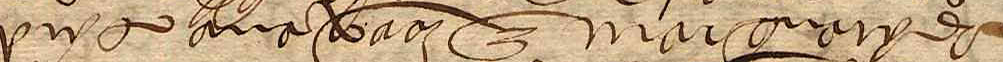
pryto ana v̄aaz item marguaryda
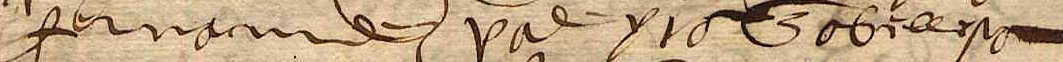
fernamdez padeyra item a bellesa
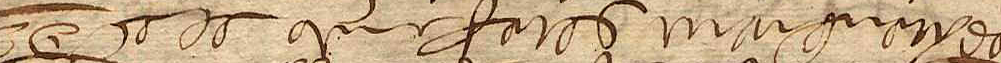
item ē cata que faras marguaryda
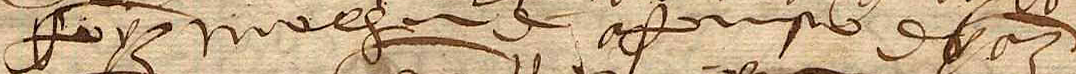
Rōiz molher de afomso dyaz
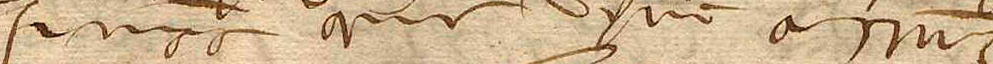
Jrmāa que vyue a cruz
